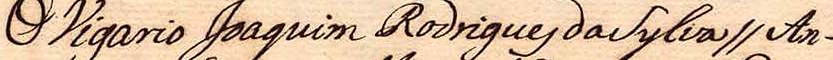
O Vigario Joaquim Rodrigues da Sylva // An
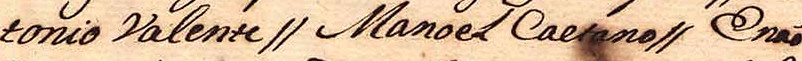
tonio Valente // Manoel Caetano // E naõ
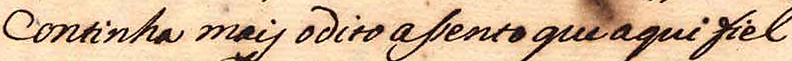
continha mais o dito assento que aqui fiel
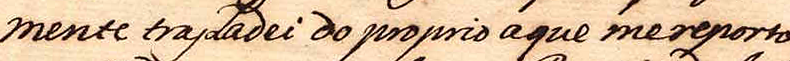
mente trasladei do proprio a que me reporto
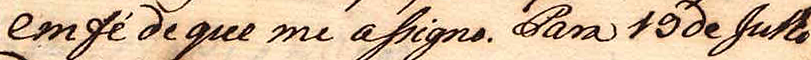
em fé de que me assigno. Para 19 de Julho
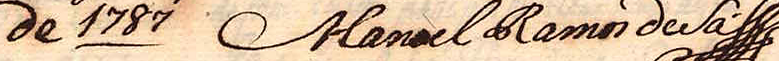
de 1787 Manoel Ramos de Sá
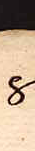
8
